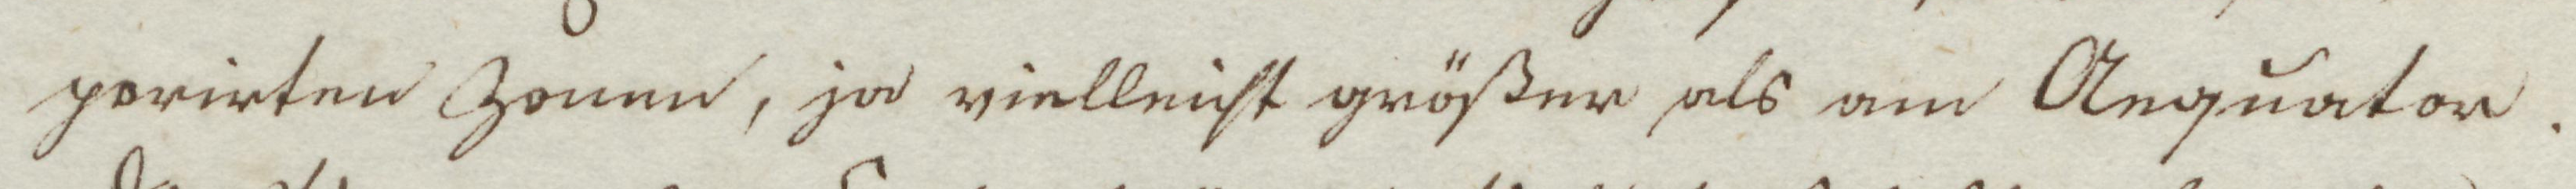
perirten Zonen, ja vielleicht größer als am Aequator.
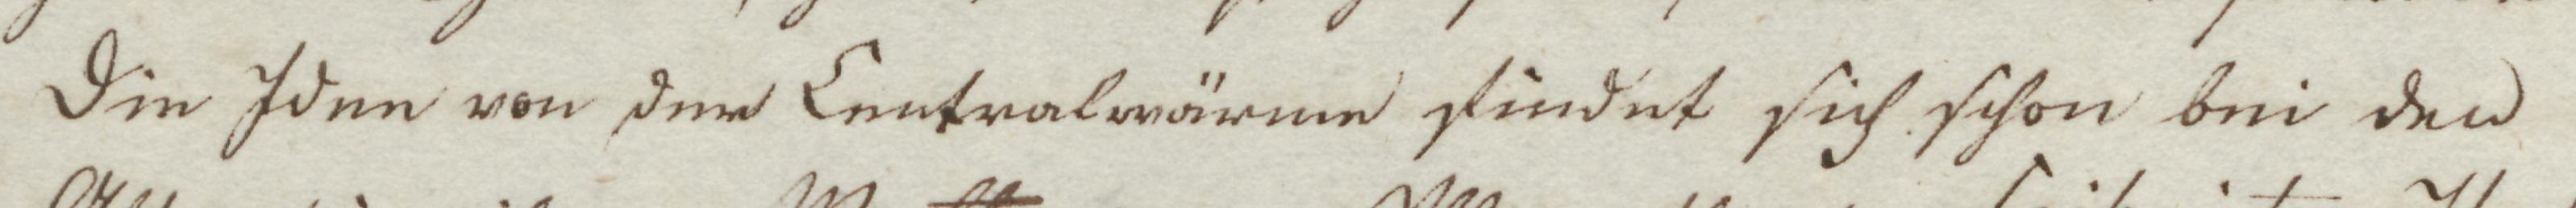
Die Idee von der Centralwärme findet sich schon bei den
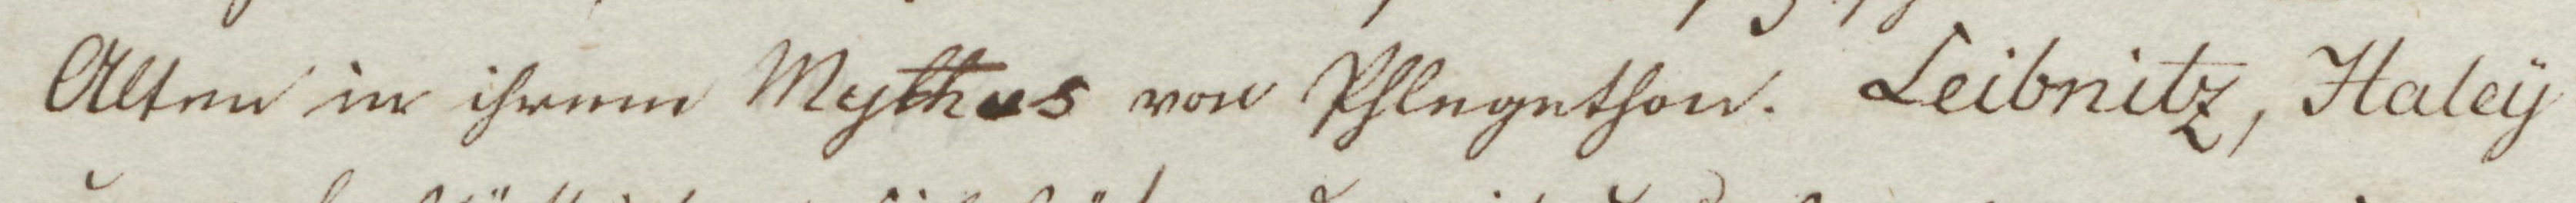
Alten in ihrem Mythus von Phlegethon. Leibnitz, Haleÿ
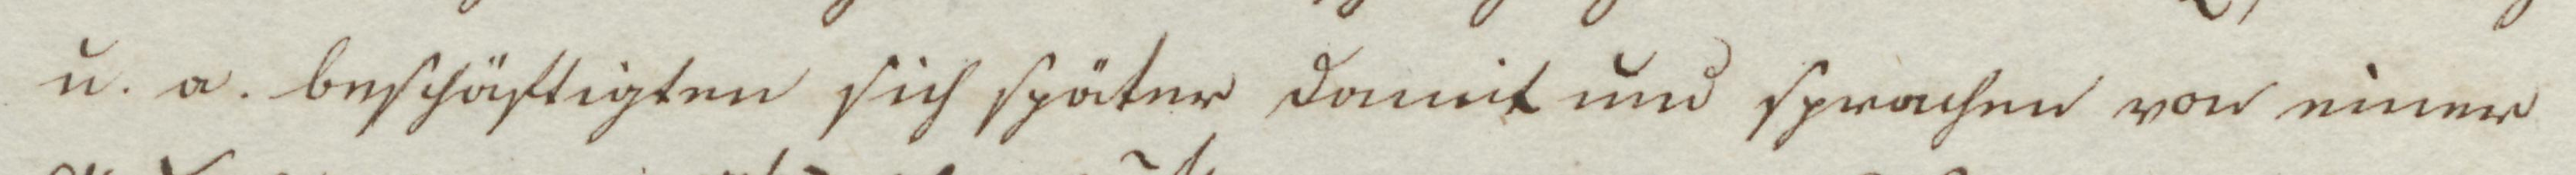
u. a. beschäftigten sich später damit und sprachen von einer
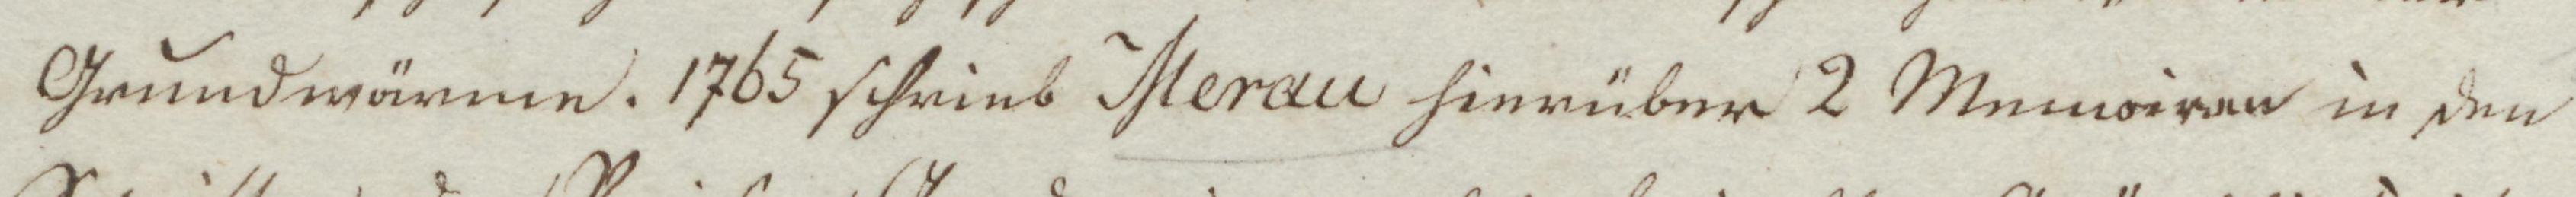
Grundwärme. 1765 schrieb Merau hierüber 2 Memoiren in den
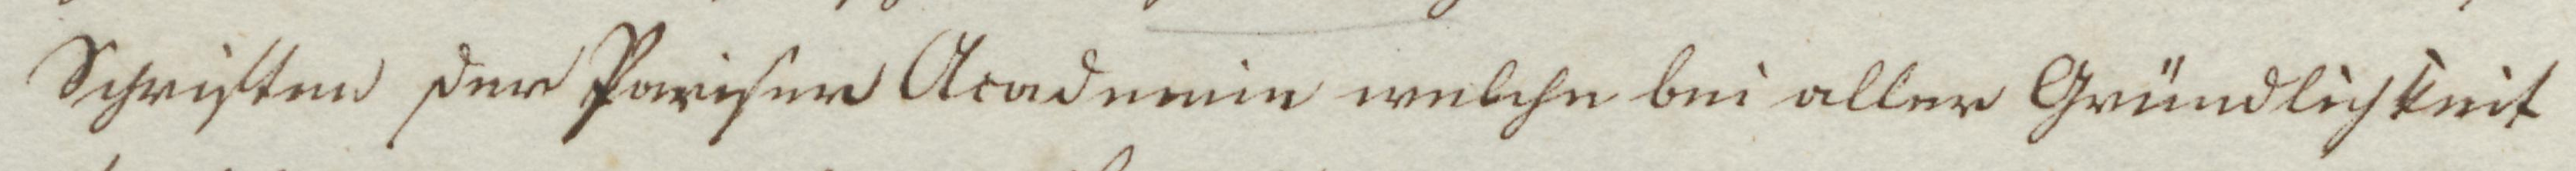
Schriften der Pariser Academie welche bei aller Gründlichkeit
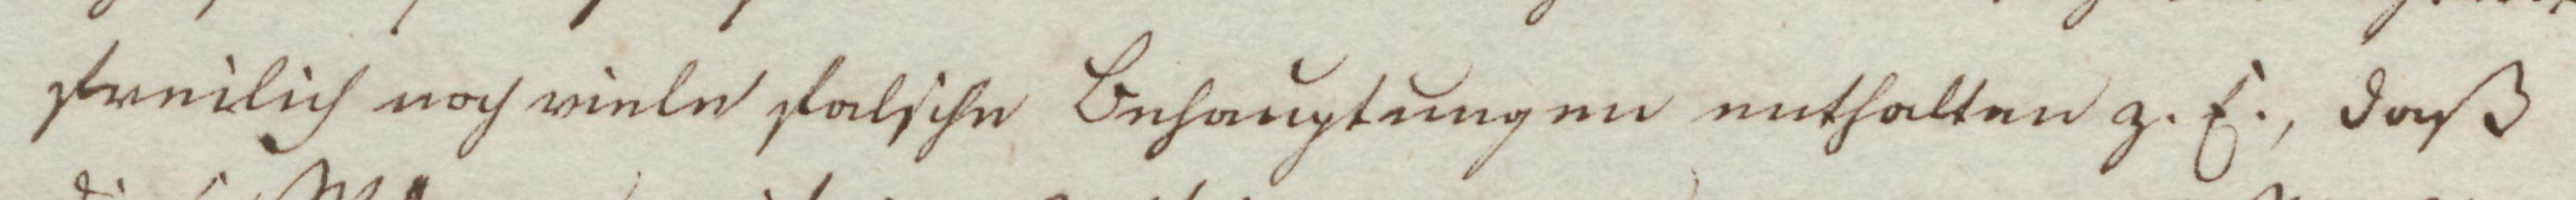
freilich noch viele falsche Behauptungen enthalten z. E., daß
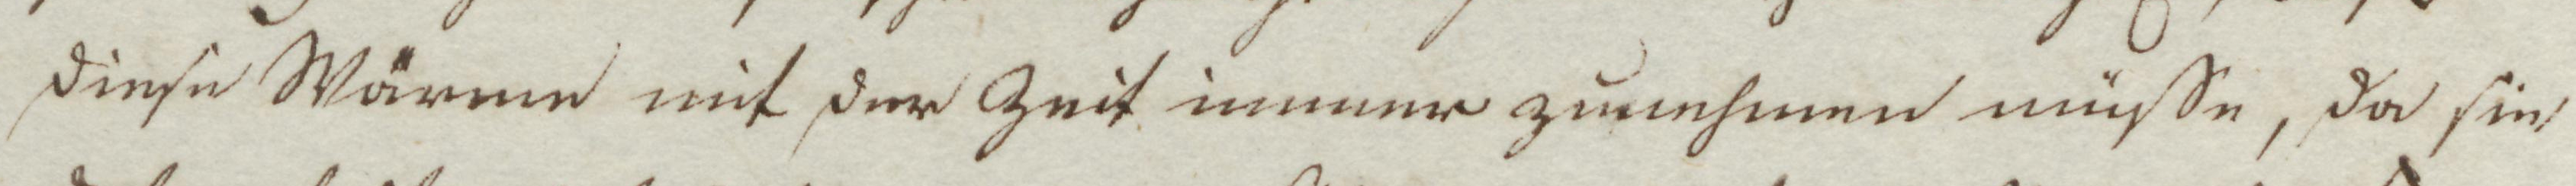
diese Wärme mit der Zeit immer zunehmen müsse, da sie
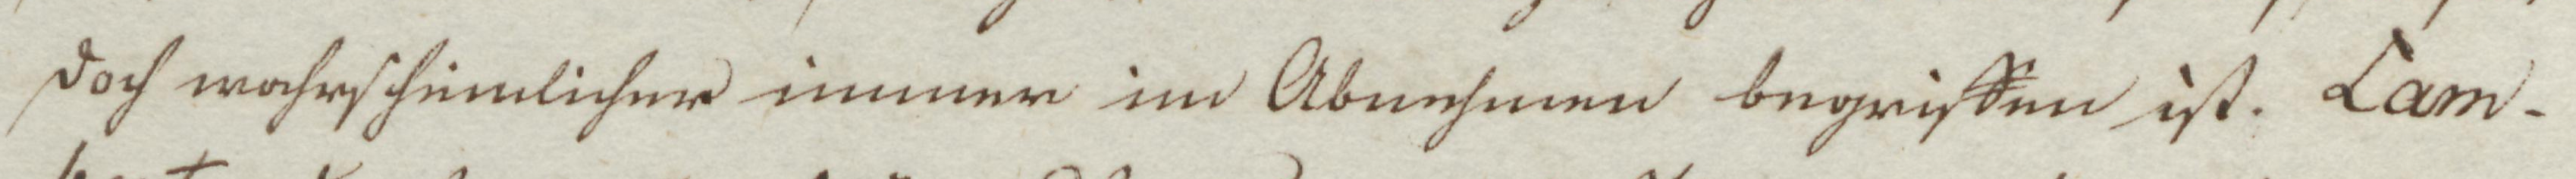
doch wahrscheinlicher immer im Abnehmen begriffen ist. Lam-
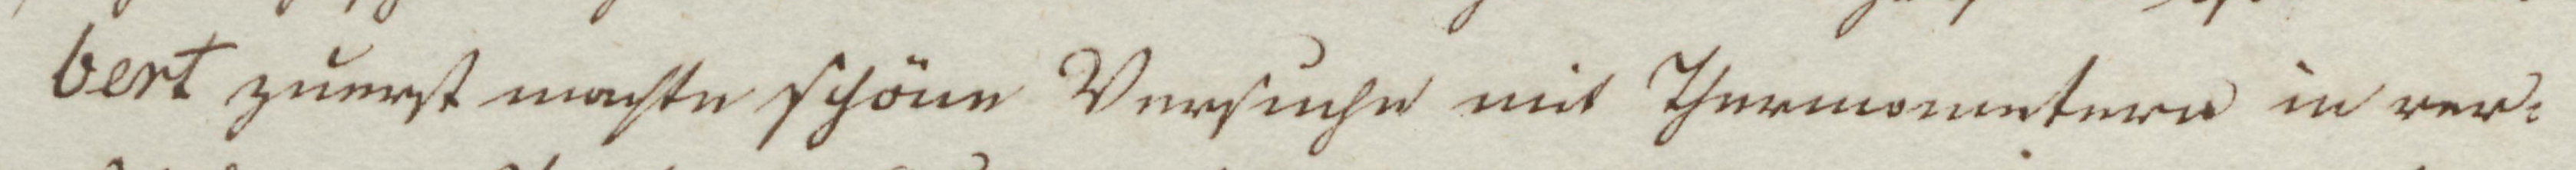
bert zuerst machte schöne Versuche mit Thermometern in ver-
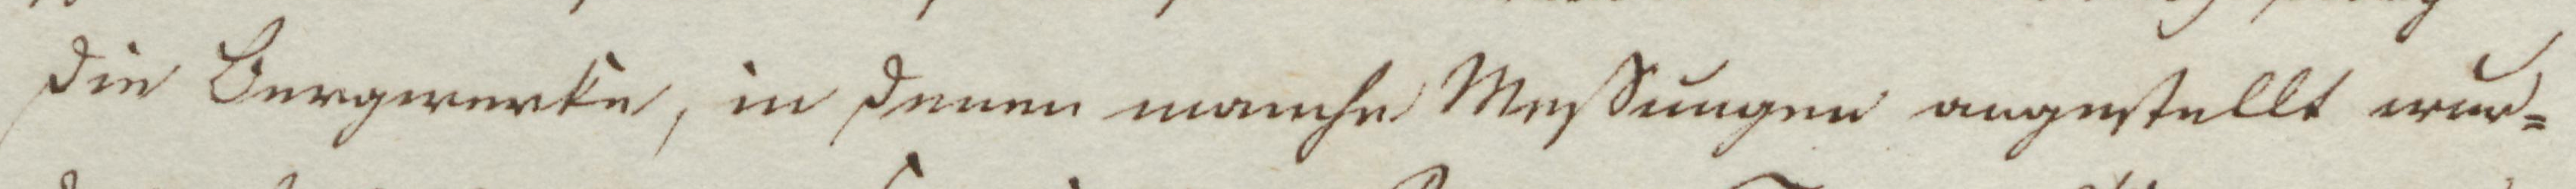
die Bergwerke, in denen manche Messungen angestellt wur-
